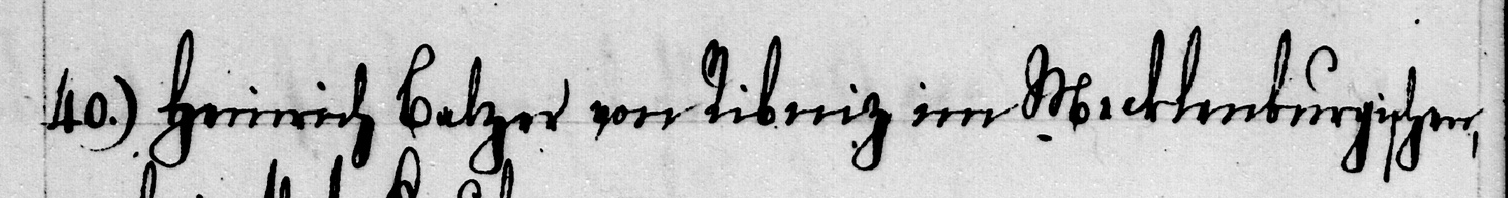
40.) Heinrich Balzer von Ribniz im Mecklenburgischen,
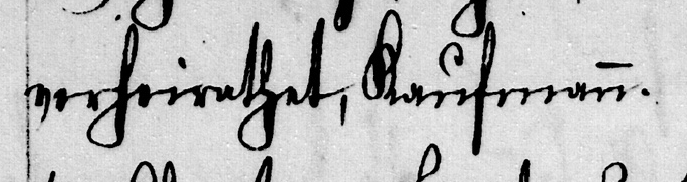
verheirathet, Kaufmann.
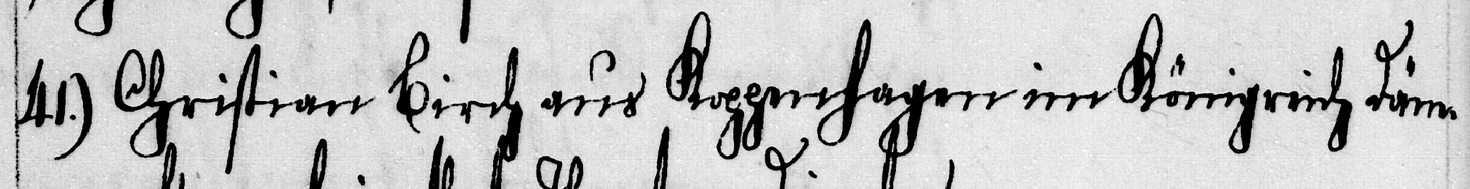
41.) Christian Birch aus Koppenhagen im Königreich Däne¬
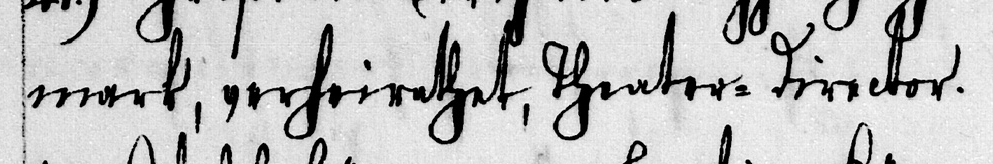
mark, verheirathet, Theater-Director.
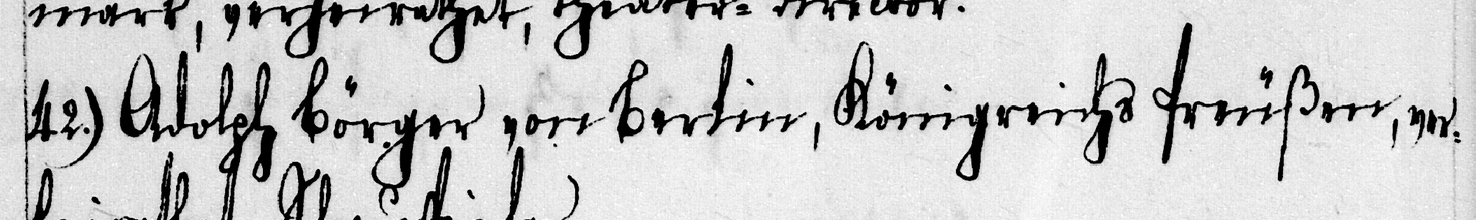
42.) Adolph Börger von Berlin, Königreichs Preußen, ver¬
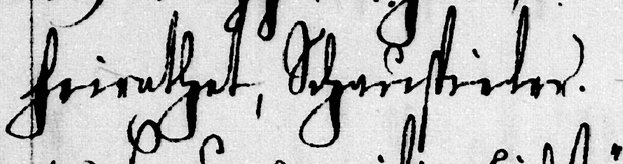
heirathet, Schauspieler.
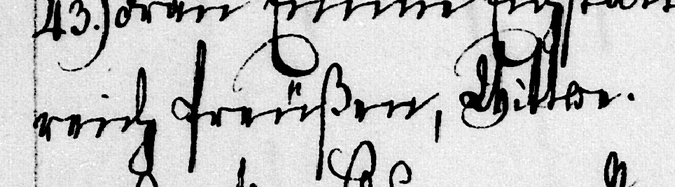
reich Preußen, Wittwe.
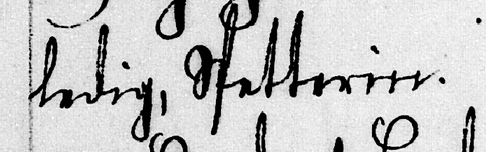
ledig, Spetterin.
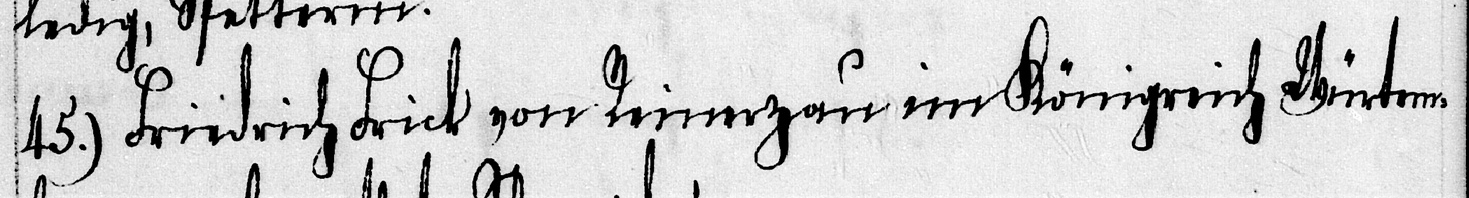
45.) Friedrich Frick von Reinerzau im Königreich Würtem¬
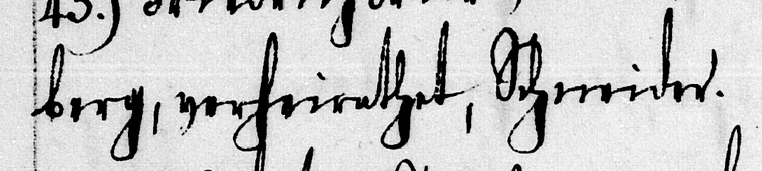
berg verheirathet, Schneider.
